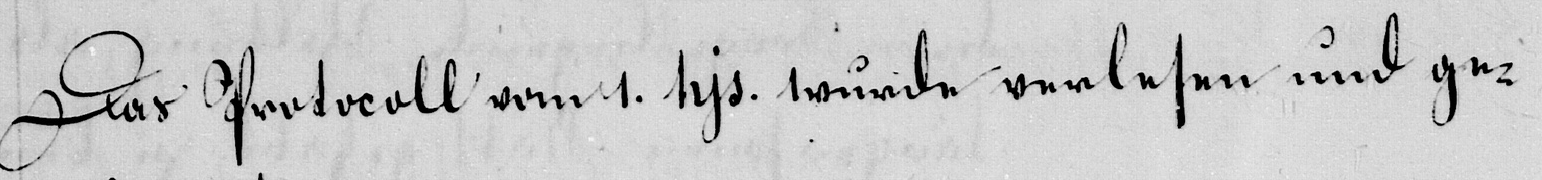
Das Protocoll vom 1. hjs. wurde verlesen und ge¬
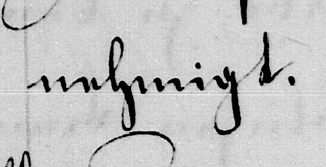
nehmigt.
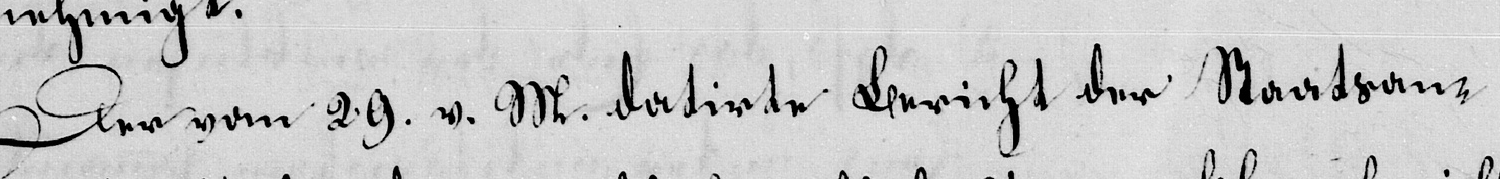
Der vom 29. v. M. datirte Bericht der Staatsan¬
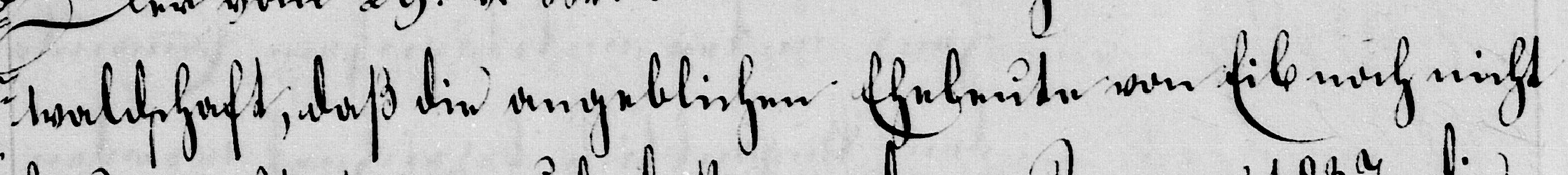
waldschaft, daß die angeblichen Eheleute von Eib noch nicht
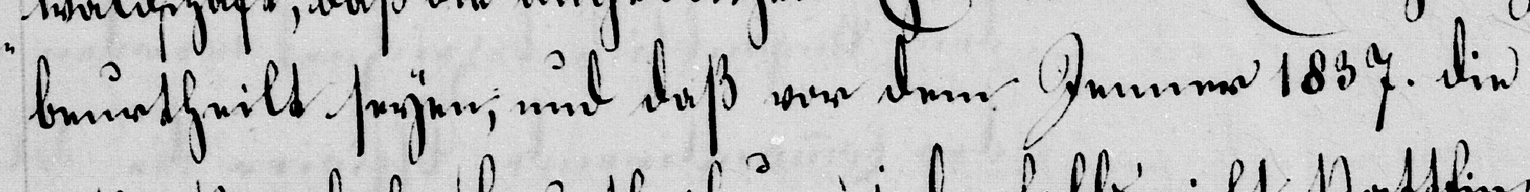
beurtheilt seyen, und daß vor dem Jenner 1837. die
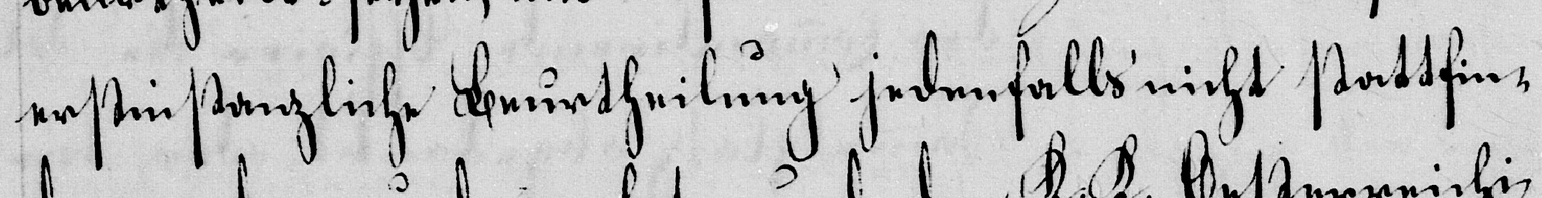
erstinstanzliche Beurtheilung jedenfalls nicht stattfin¬
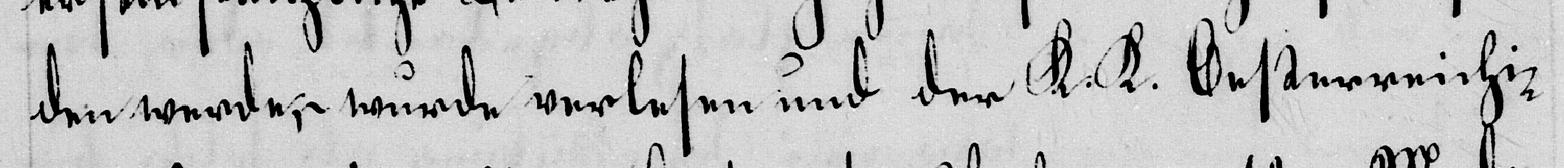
den werde, – wurde verlesen und der K. K. Oesterreichi¬
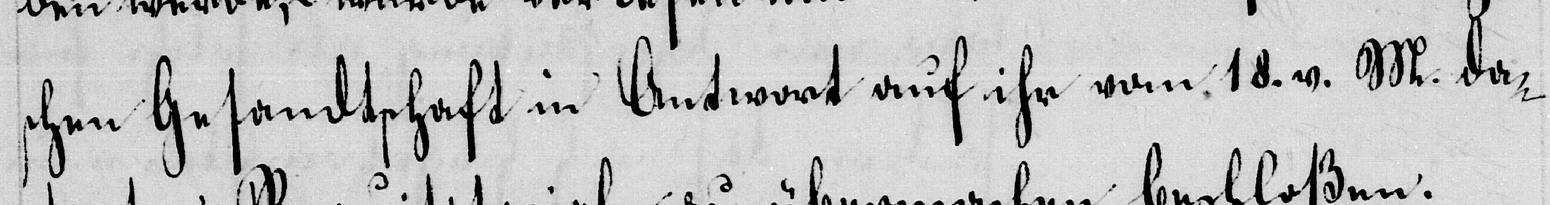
schen Gesandtschaft in Antwort auf ihr vom 18. v. M. da¬
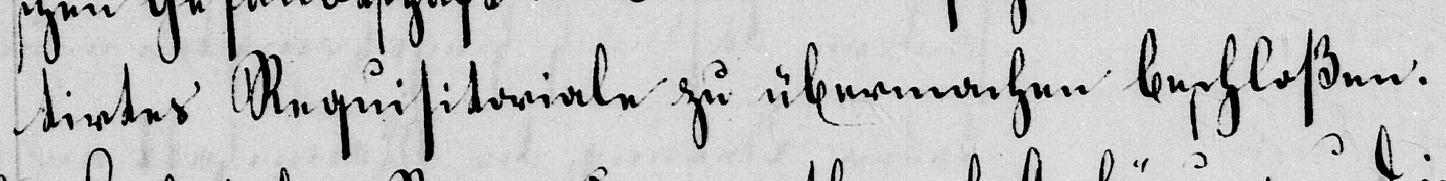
tirtes Requisitoriale zu übermachen beschloßen.
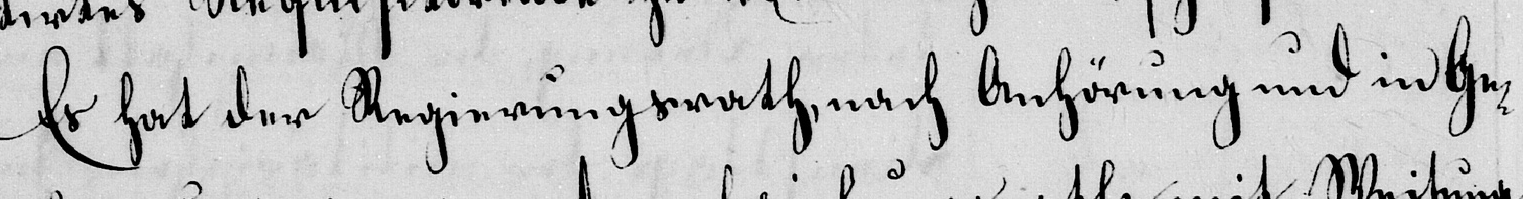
Es hat der Regierungsrath, nach Anhörung und in Ge¬
